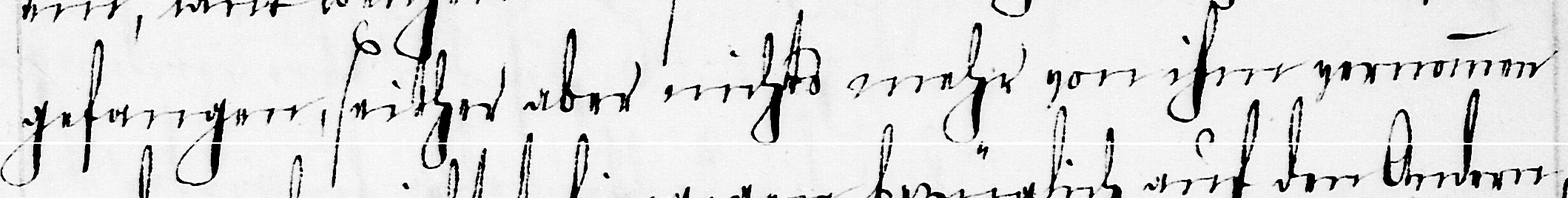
gefangen, seither aber nichts mehr von ihm vernommen
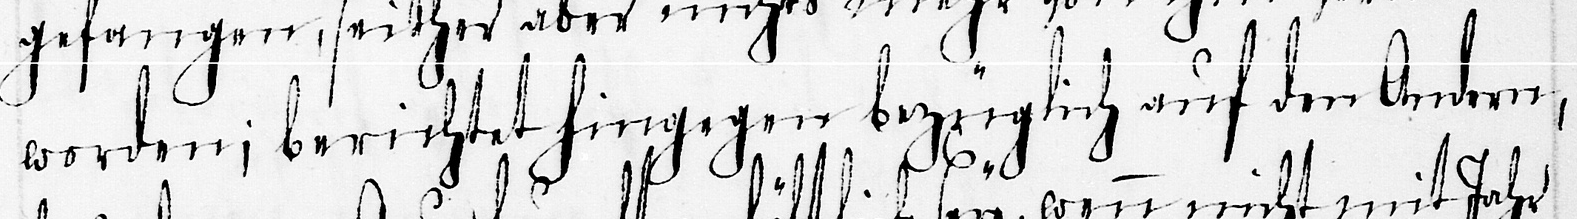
worden; berichtet hingegen bezüglich auf den Andern,
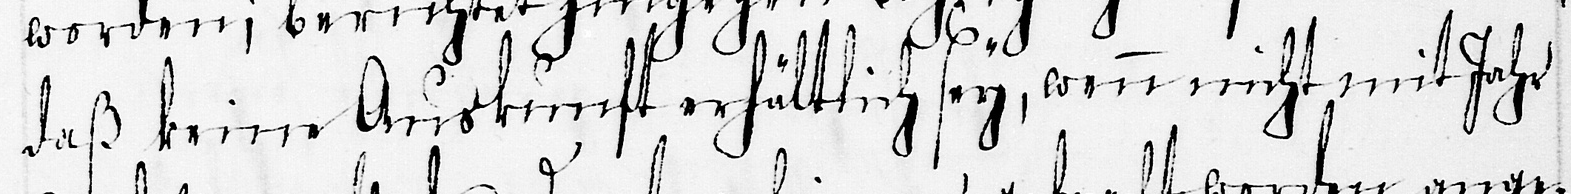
daß keine Auskunft erhältlich sey, wenn nicht mit Jahr
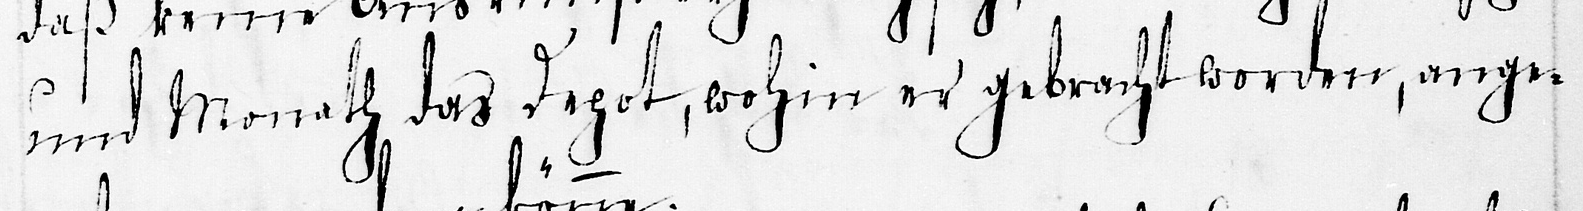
und Monath das Depot, wohin er gebracht worden, ange¬
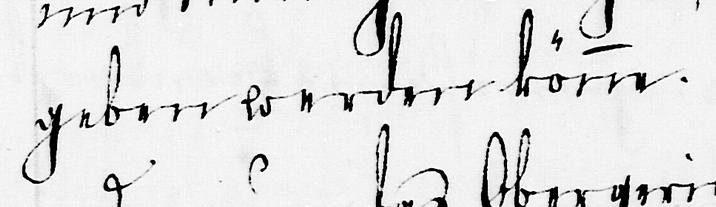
geben werden könne.
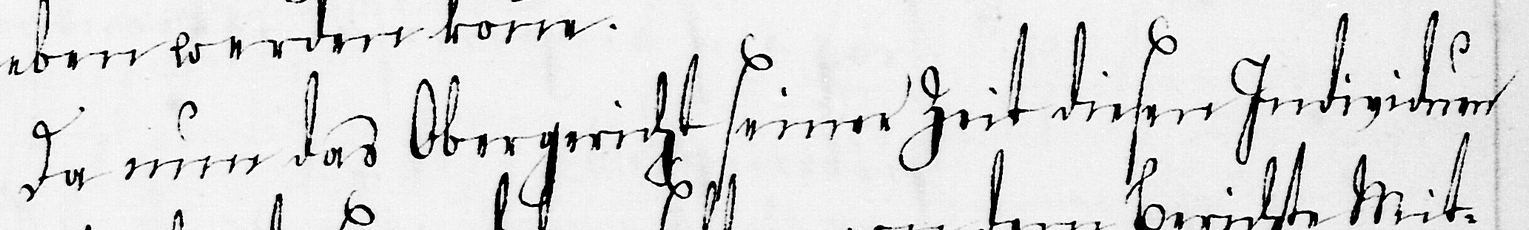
Da nun das Obergericht seiner Zeit diesen Individuen
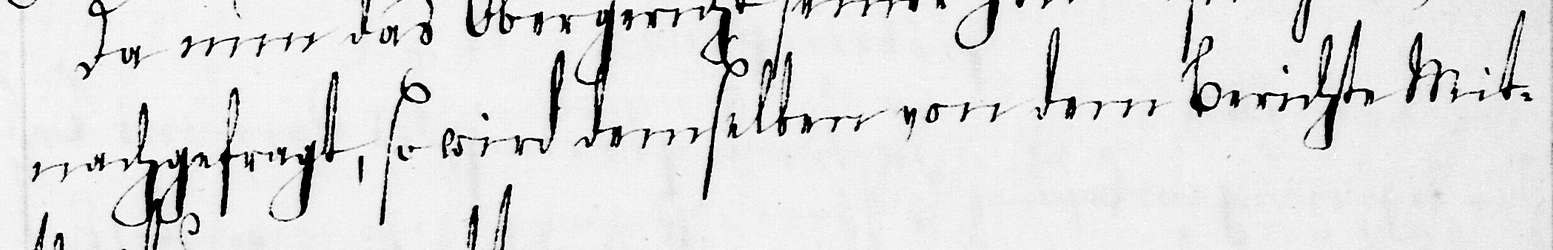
nachgefragt, so wird demselben von dem Berichte Mit¬
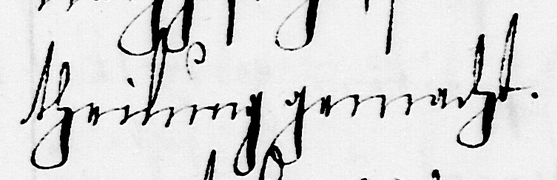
theilung gemacht.
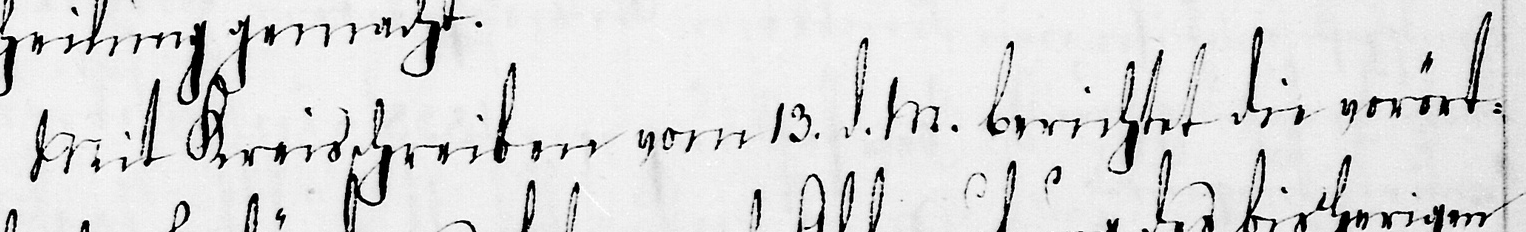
Mit Kreisschreiben vom 13. d. M. berichtet die vorört¬
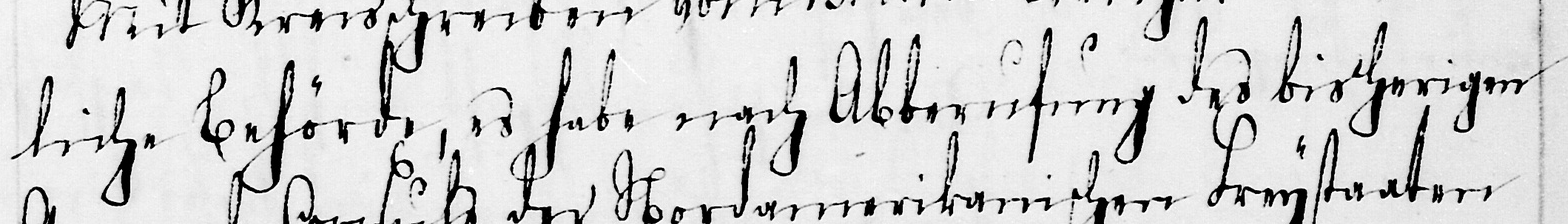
liche Behörde, es habe nach Abberufung des bisherigen
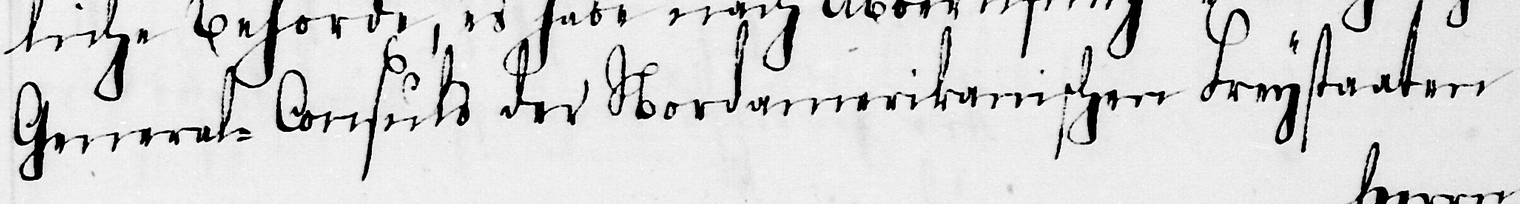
General-Consuls der Nordamerikanischen Freystaaten
